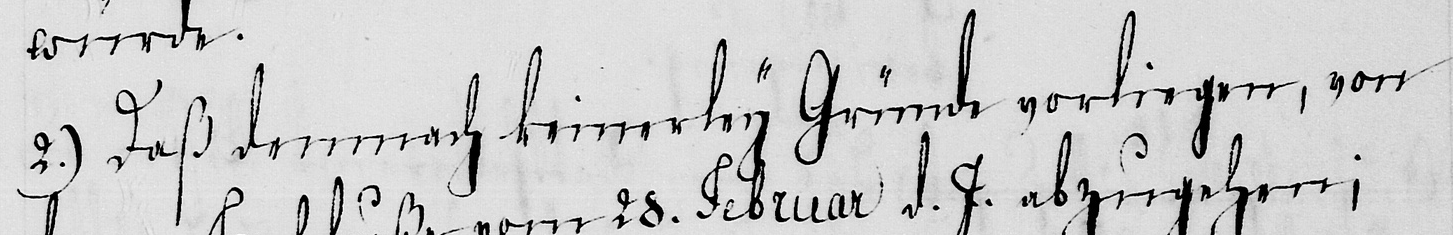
2.) Daß demnach keinerley Gründe vorliegen, von
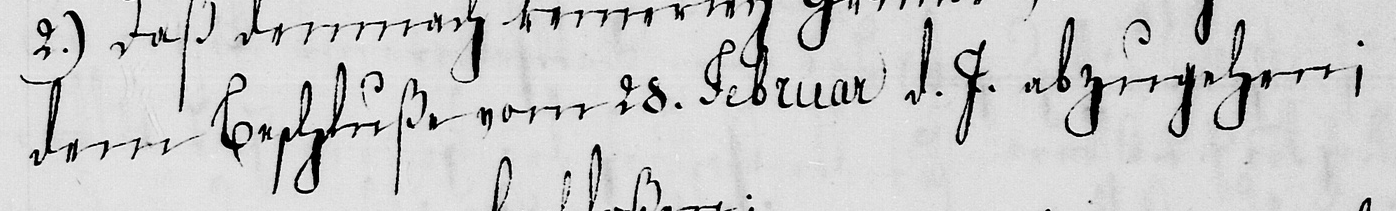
dem Beschluße vom 28. Februar d. J. abzugehen;
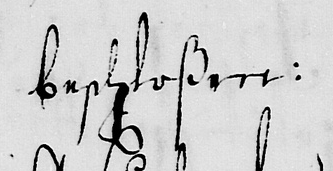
beschloßen:
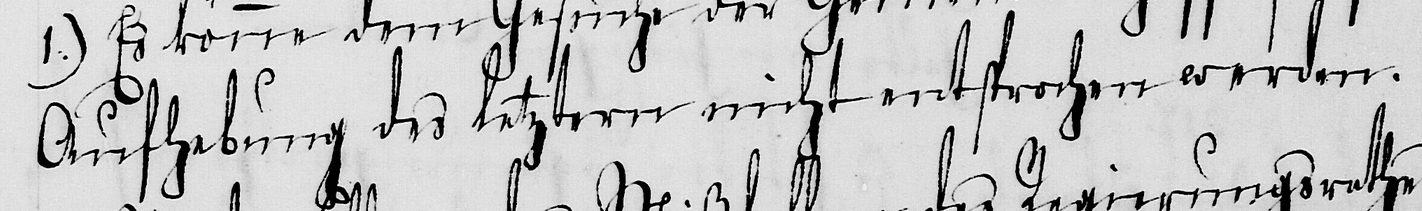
Aufhebung des letztern nicht entsprochen werden.
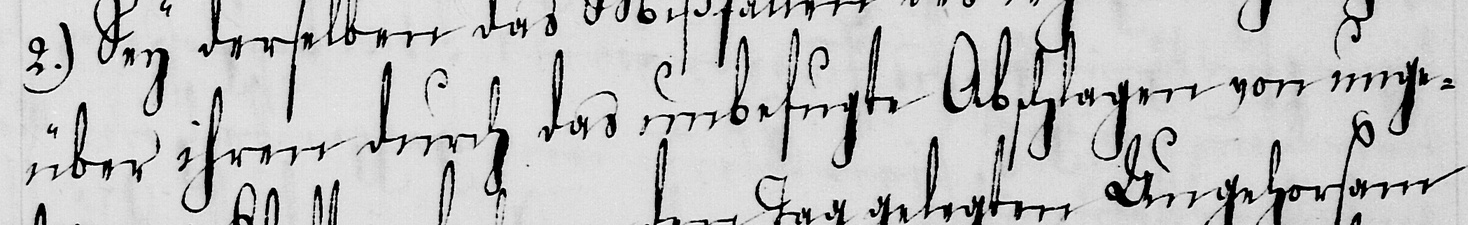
über ihren durch das unbefugte Abschlagen von unge¬
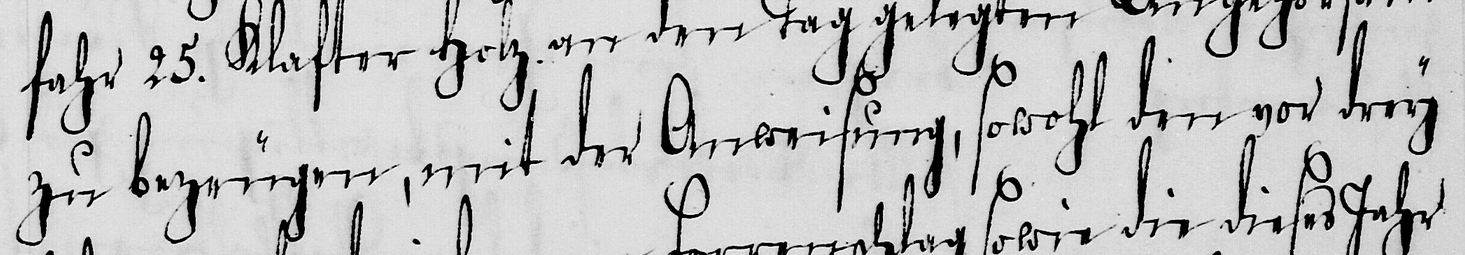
zu bezeugen, mit der Anweisung, sowohl den vor drey
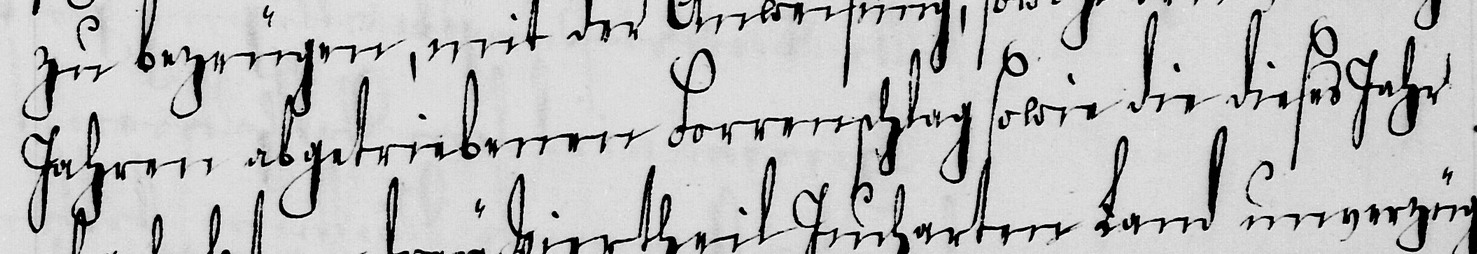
Jahren abgetriebenen Forrenschlag sowie die dieses Jahr
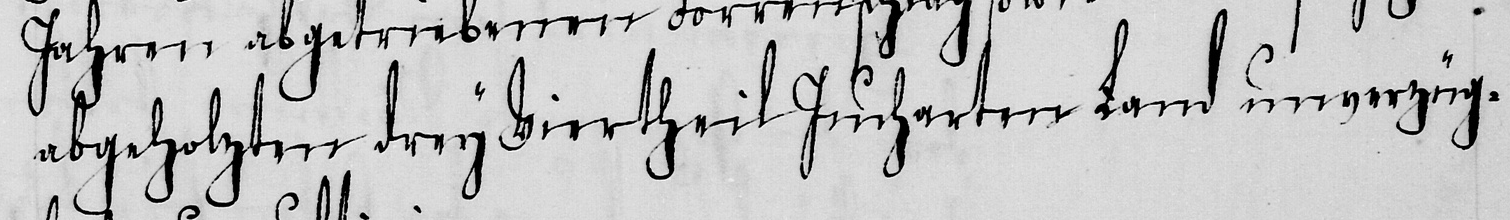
abgeholzten drey Viertheil Jucharten Land unverzüg¬
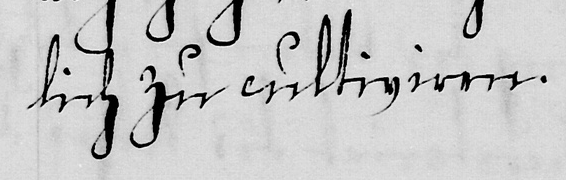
lich zu cultiviren.
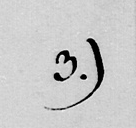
2.)
